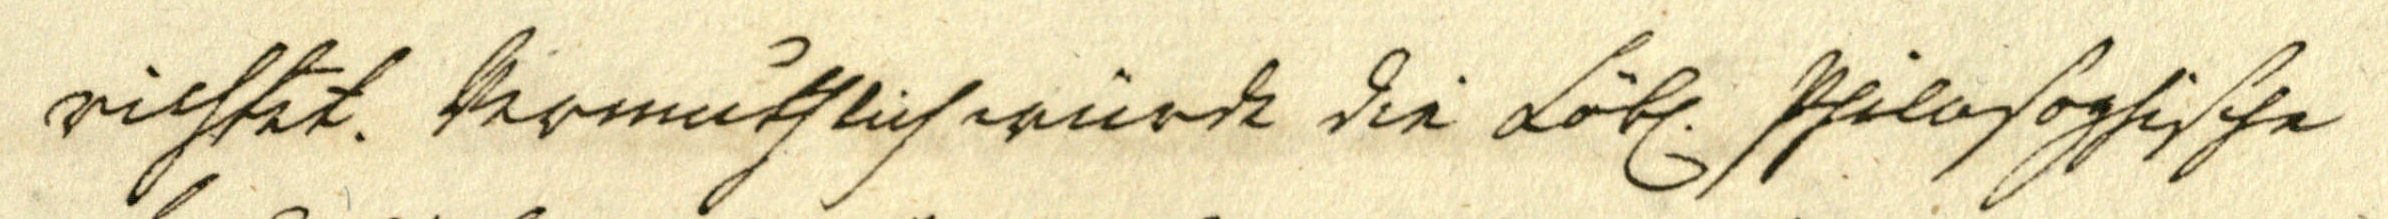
richtet. Vermuthlich würde die Löbl. Philosophische
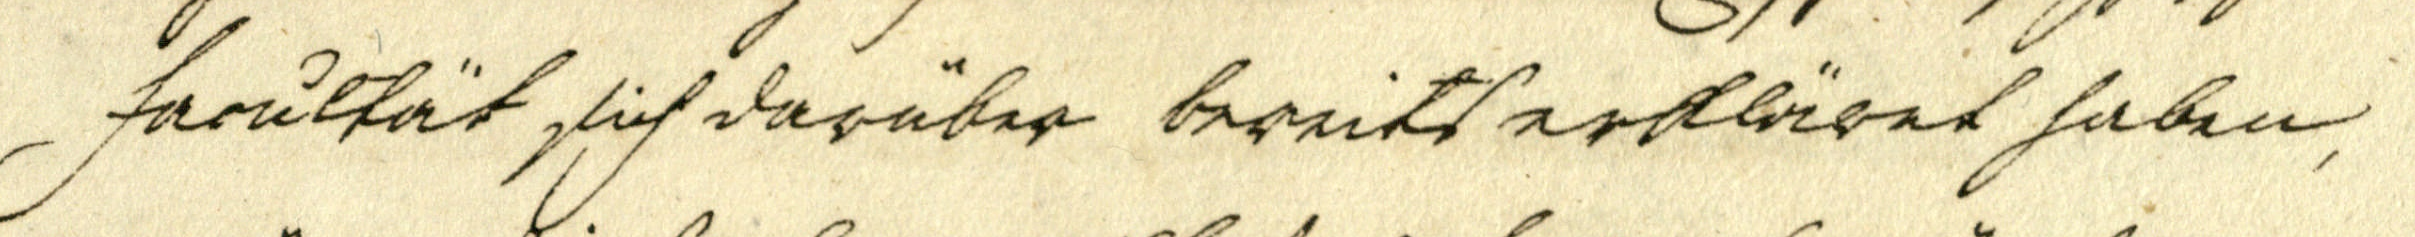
Facultät sich darüber bereits erkläret haben,
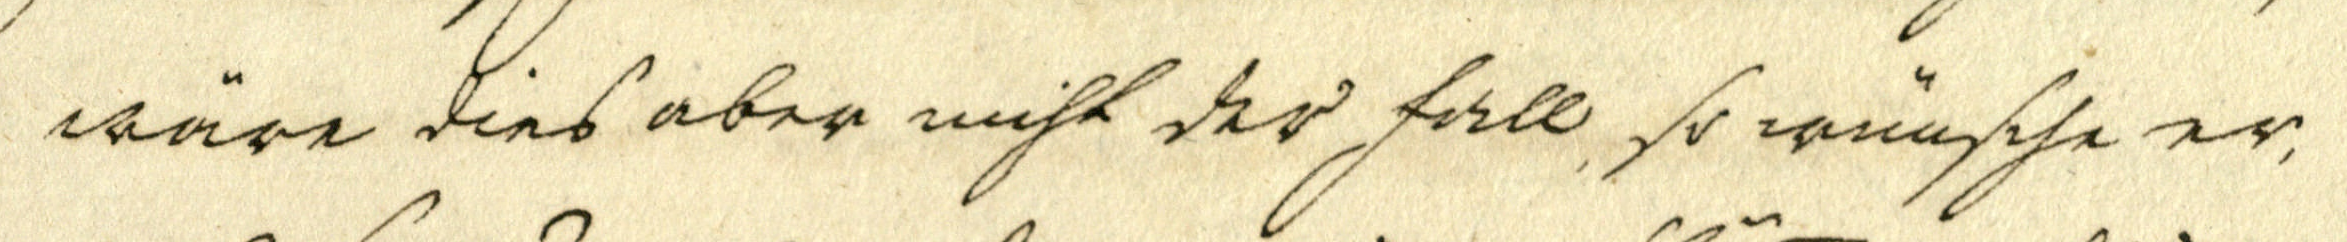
wäre dies aber nicht der Fall, so wünsche er,
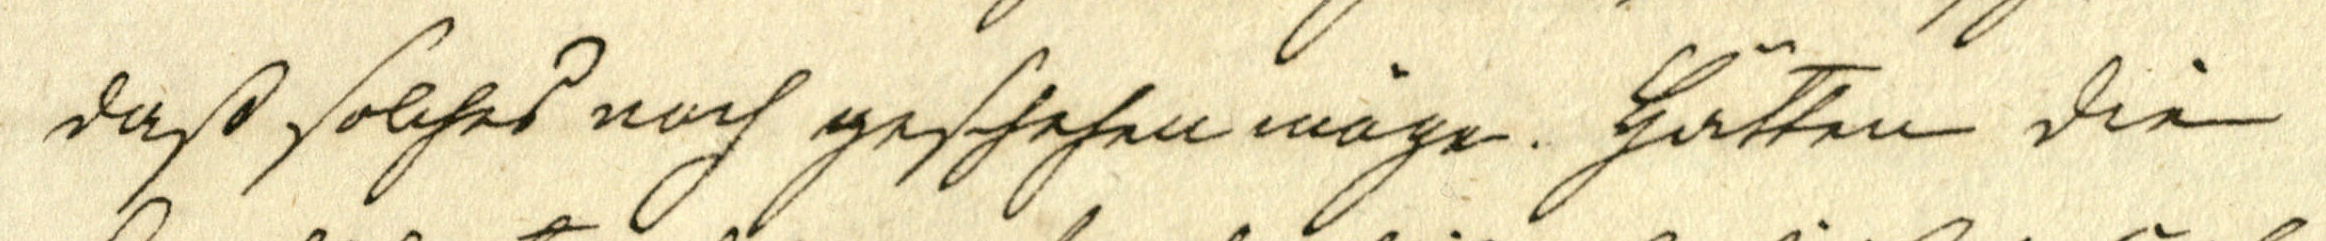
daß solches noch geschehen möge. Hätten die
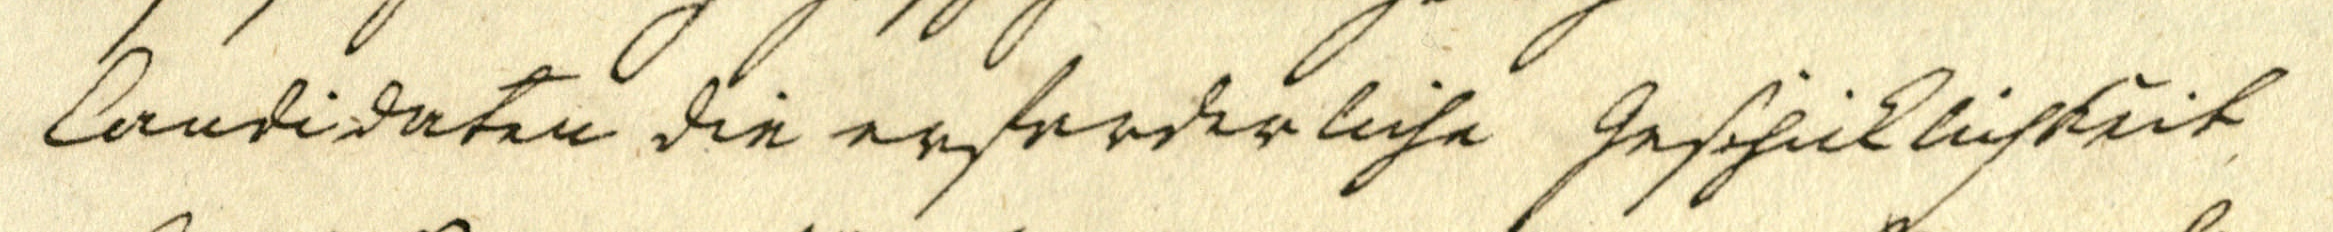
Candidaten die erforderliche Geschicklichkeit
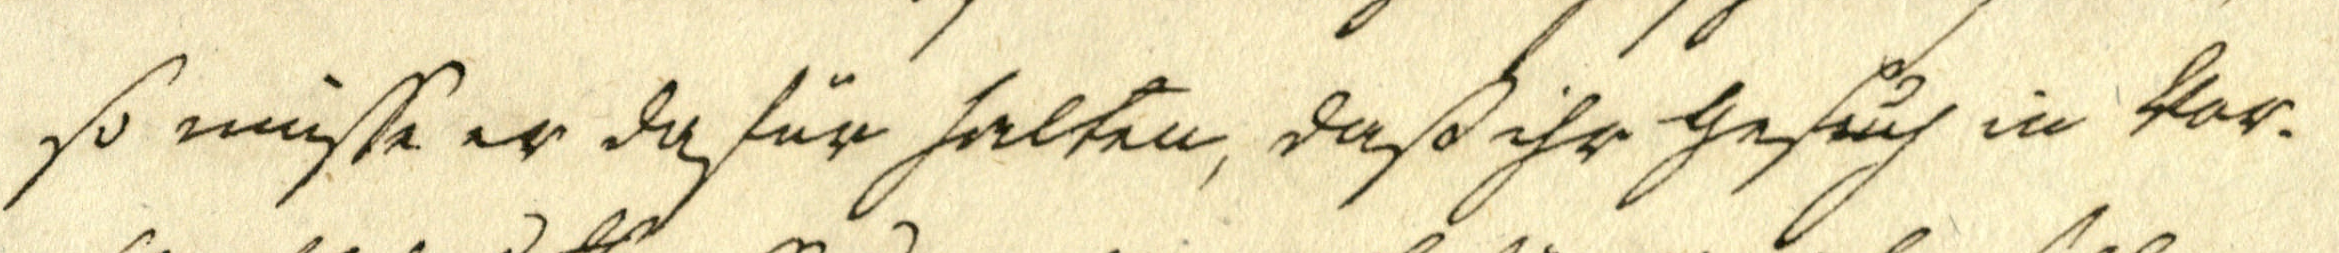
so müsse er dafür halten, daß ihr Gesuch in Vor¬
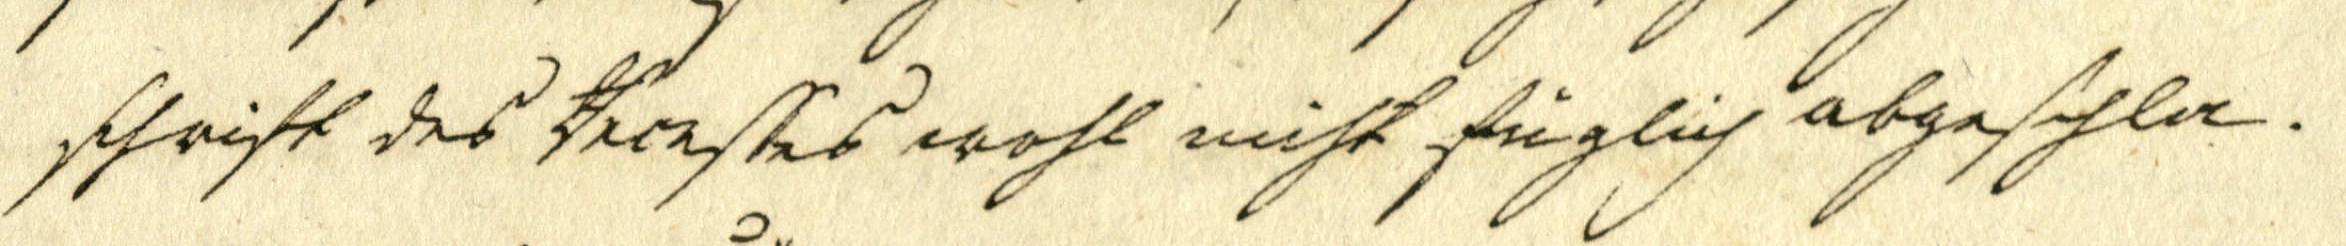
schrift des Recesses wohl nicht füglich abgeschla¬
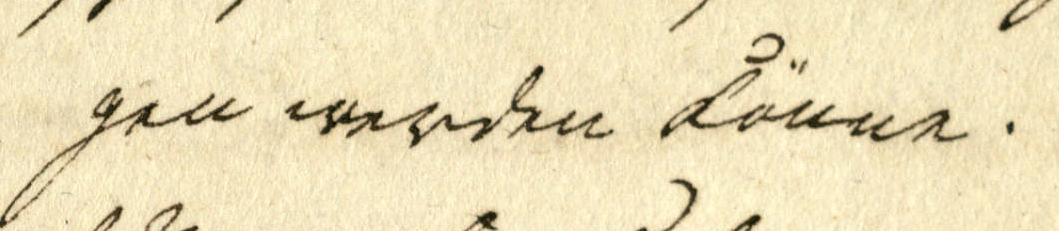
gen werden könne.
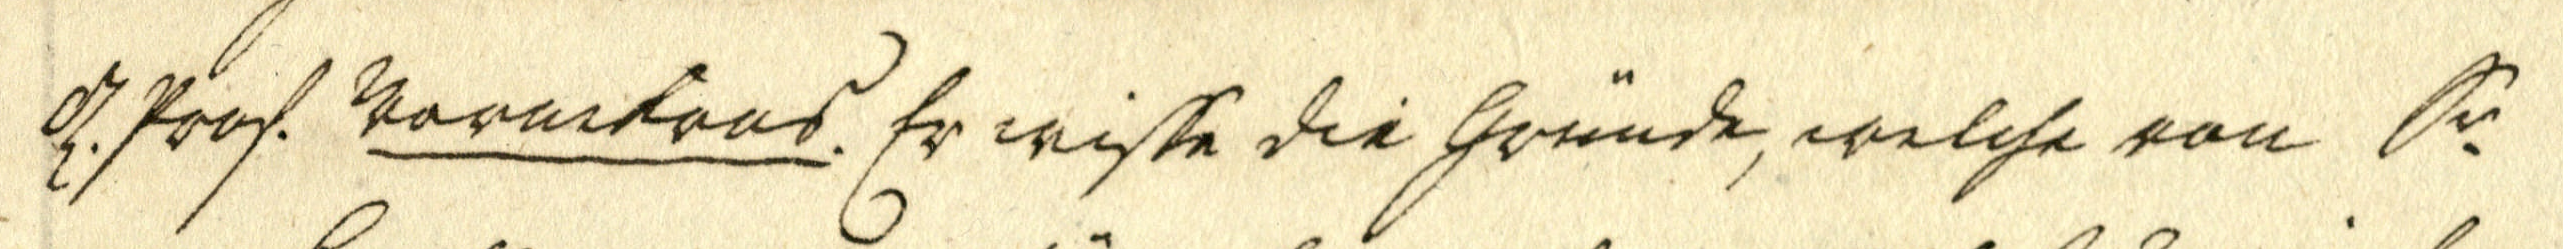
dh. Prof. Warnekros. Er wisse die Gründe, welche von Sr.
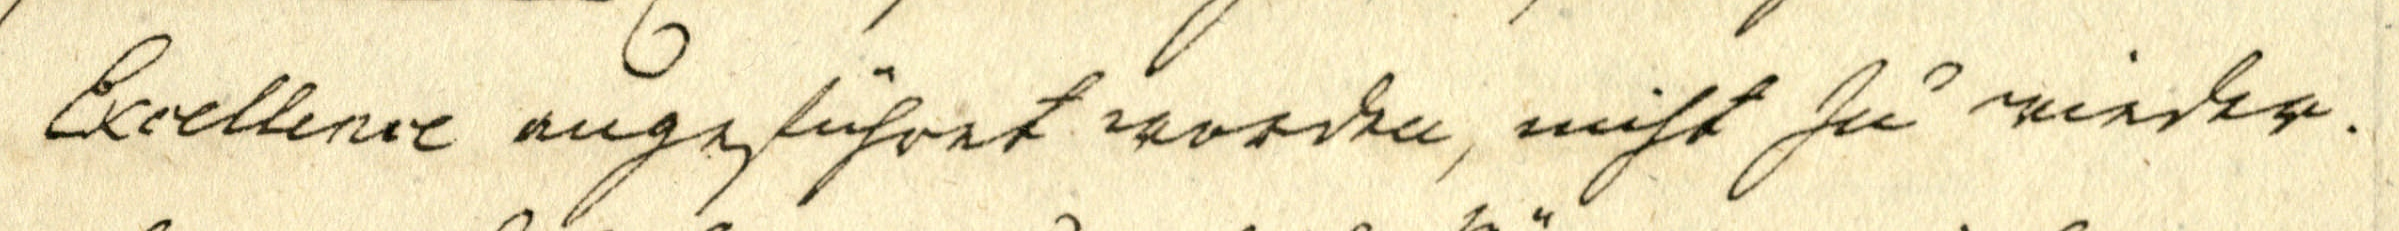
Excellence angeführet worden, nicht zu wieder¬
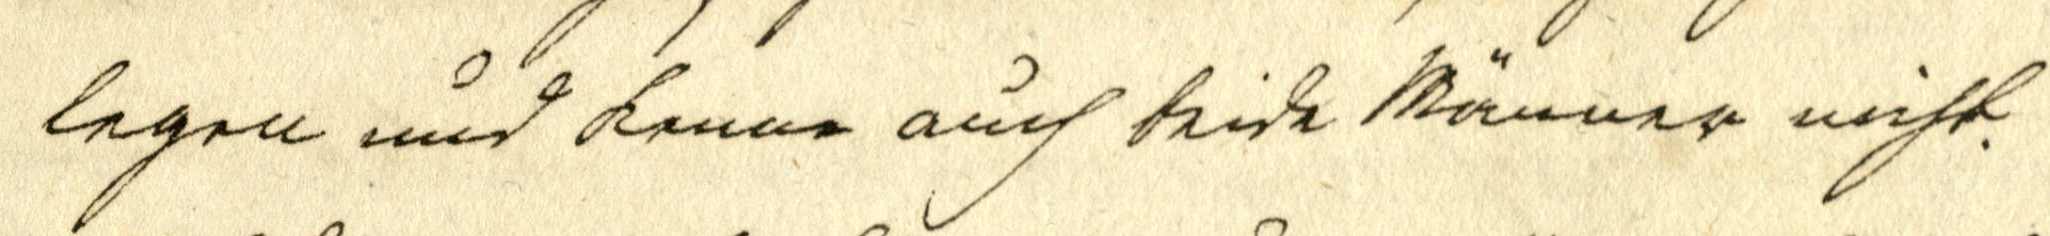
legen und kenne auch beide Männer nicht.
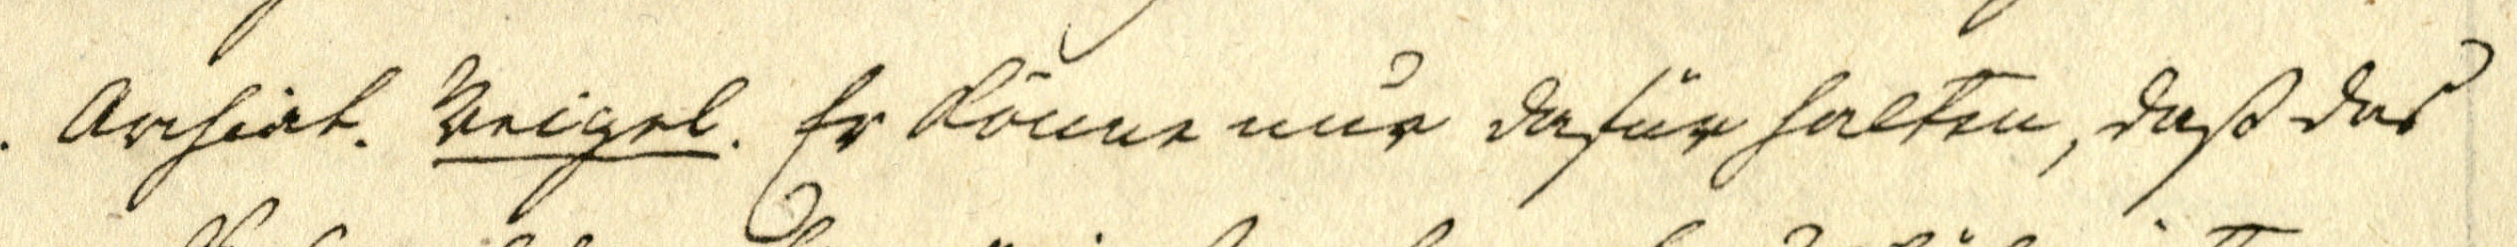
Archiat. Weigel. Er könne nur dafür halten, daß das
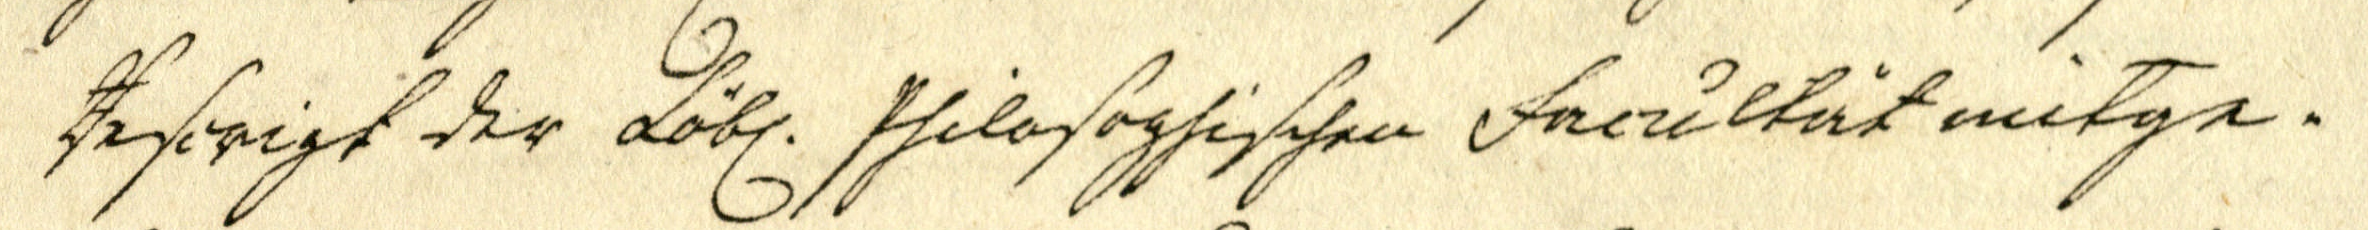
Rescript der Löbl. Philosophischen Facultät mitge¬
